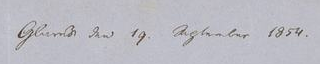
Glarus den 19. September 1854.
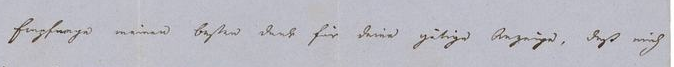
Empfange meinen besten Dank für Deine gütige Anzeige, daß mich
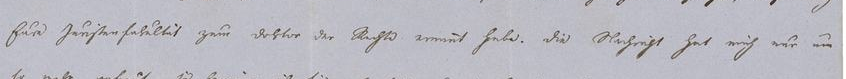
Eure Juristenfakultät zum Doktor der Rechte ernannt habe. Die Nachricht hat mich nur um
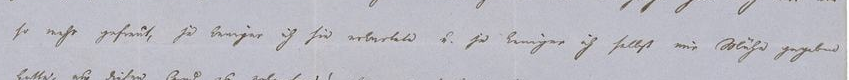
so mehr gefreut, je weniger ich sie erwartete u. je weniger ich selbst mir Mühe gegeben
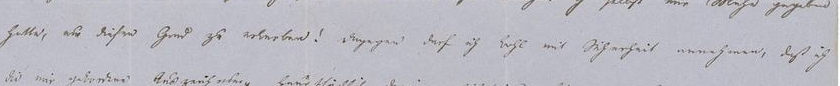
hatte, um diesen Grad zu erwerben! Dagegen darf ich wohl mit Sicherheit annehmen, daß ich
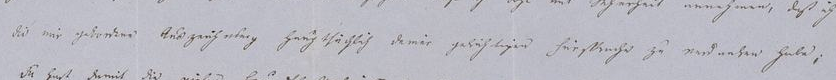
die mir gewordene Auszeichnung hauptsächlich Deiner gewichtigen Fürsprache zu verdanken habe;
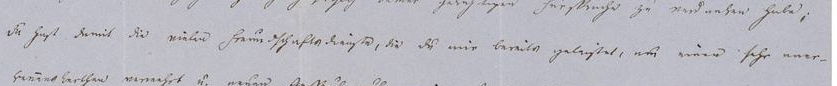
Du hast damit die vielen Freundschaftsdienste, die Du mir bereits geleistet, um einen sehr aner-
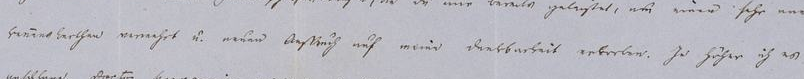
kennenswerthen vermehrt u. neuen Anspruch auf meine Dankbarkeit erworben. Je früher ich es
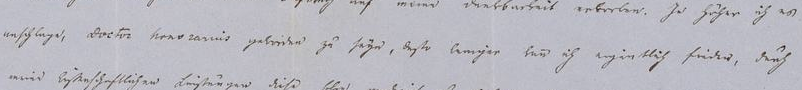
anschlage, Doctor honorarius geworden zu seyn, desto weniger kann ich eigentlich finden, durch
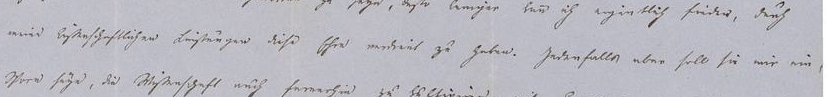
meine wissenschaftlichen Leistungen diese Ehre verdient zu haben. Jedenfalls aber soll sie mir ein
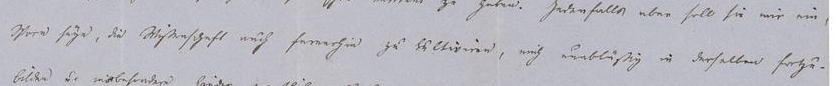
Sporn seyn, die Wissenschaft auch fernerhin zu kultiviren, mich unablässig in derselben fortzu-
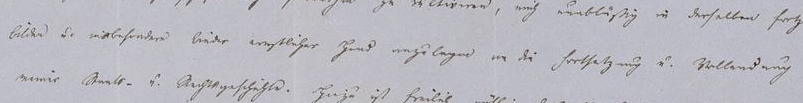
bilden u. insbesondere wieder ernstlicher Hand anzulegen an die Fortsetzung u. Vollendung
